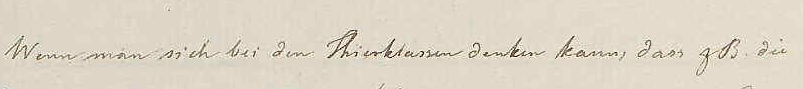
Wenn man sich bei den Thierklassen denken kann, dass zB. die
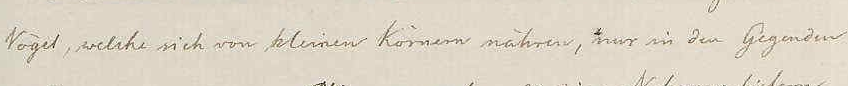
Vögel, welche sich von kleinen Körnern nähren, nur in den Gegenden
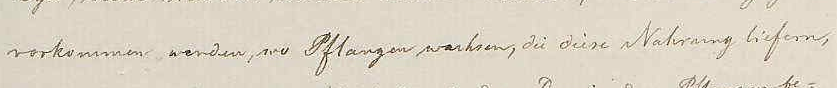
vorkommen werden, wo Pflanzen wachsen, die diese Nahrung liefern,
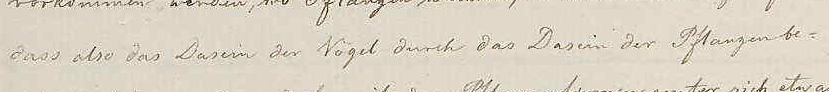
dass also das Dasein der Vögel durch das Dasein der Pflanzen be-
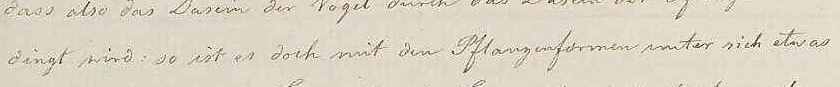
dingt wird: so ist es doch mit den Pflanzenformen unter sich etwas
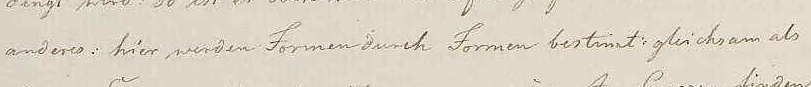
anderes: hier werden Formen durch Formen bestimt: gleichsam als
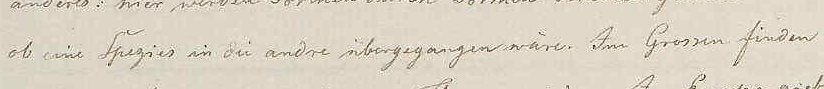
ob eine Spezies in die andre übergegangen wäre. Im Grossen finden
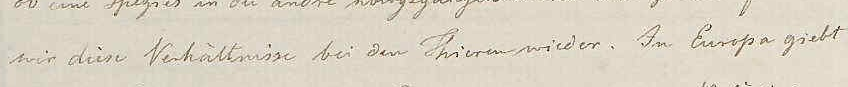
wir diese Verhältnisse bei den Thieren wieder. In Europa giebt
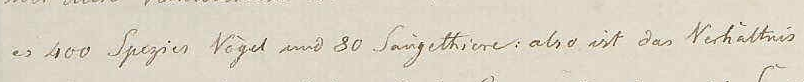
es 400 Spezies Vögel und 80 Säugethiere: also ist das Verhältnis
